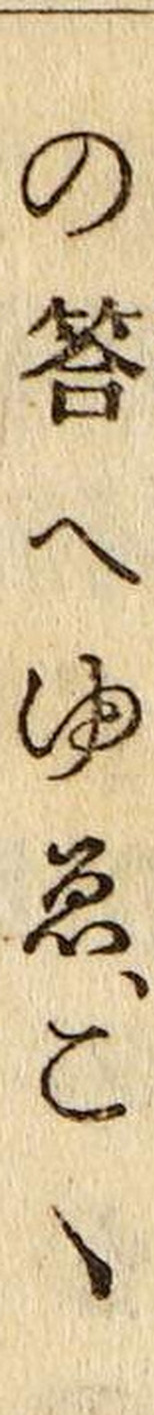の答へゆゑ、こヽ
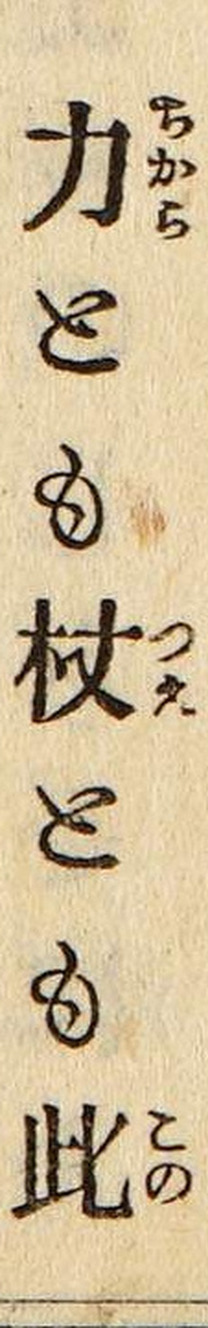力とも杖とも此
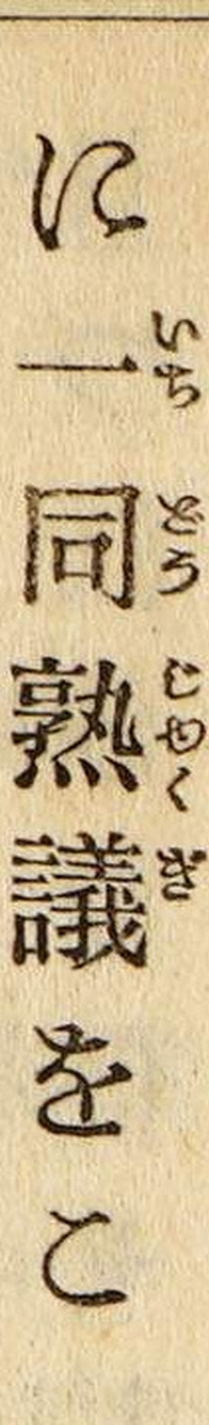に一同熟議をこ
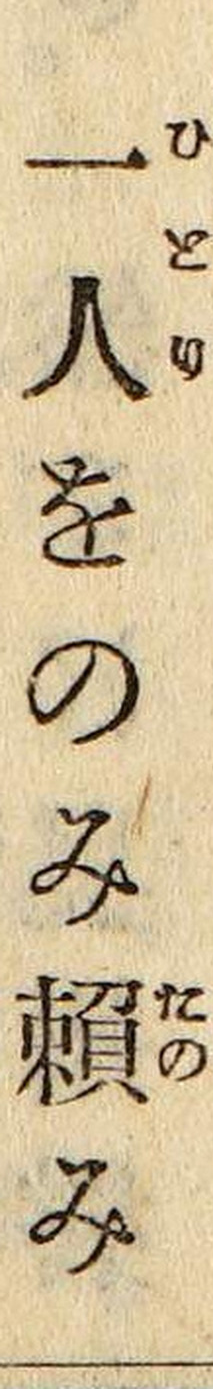一人をのみ頼み
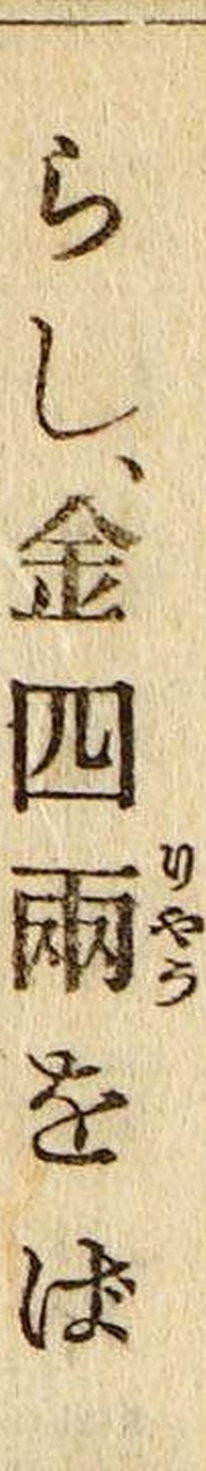らし、金四両をば
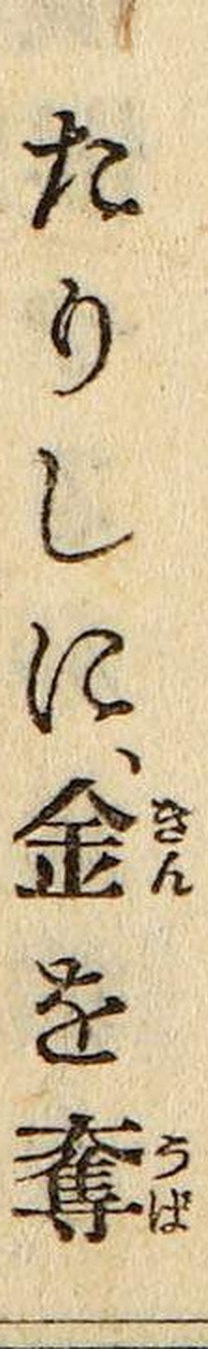たりしに、金を奪

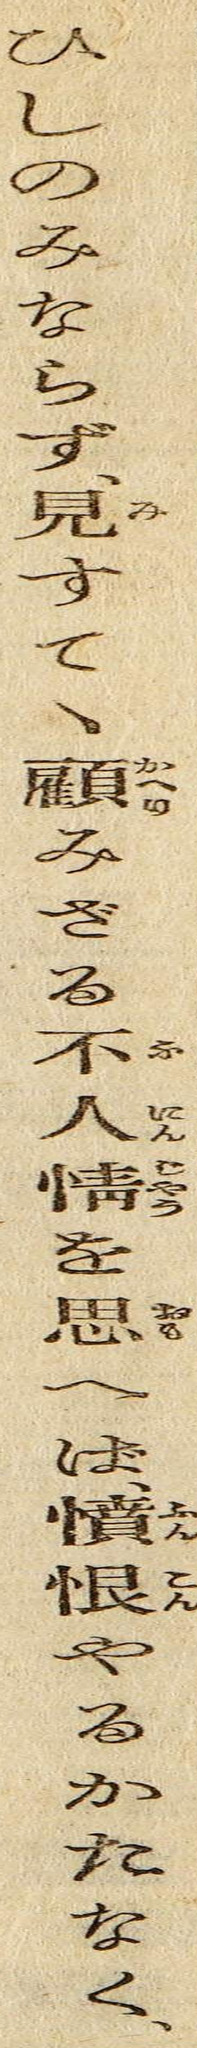ひしのみならず、見すてヽ顧みざる不人情を思へば、憤恨やるかたなく、
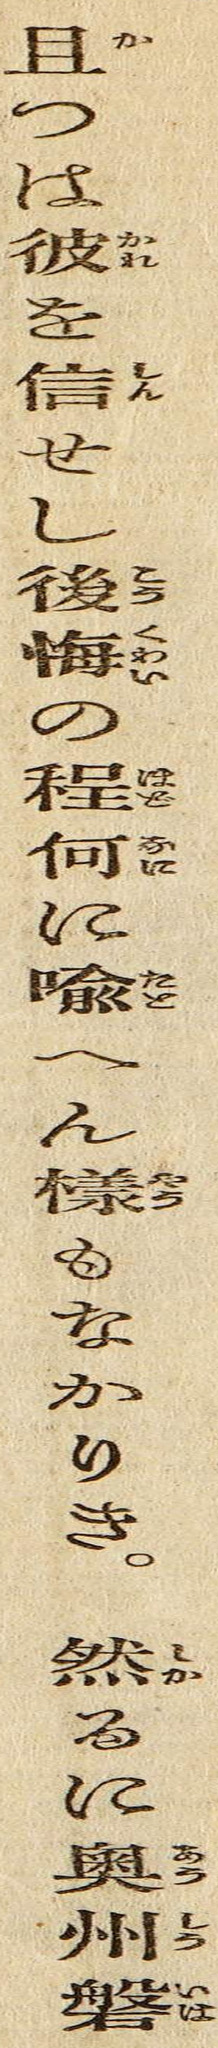且つは彼を信せし後悔の程何に喩へん様もなかりき。然るに奥州磐
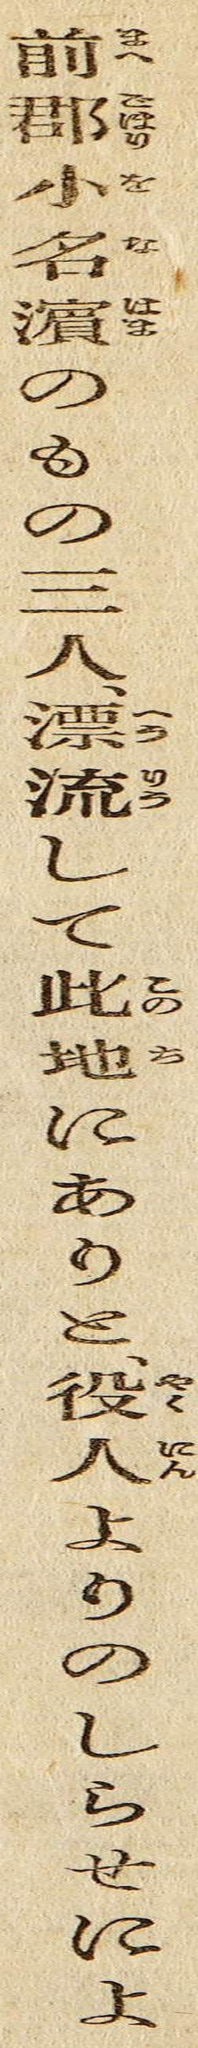前郡小名浜のもの三人、漂流して此地にありと、役人よりのしらせによ
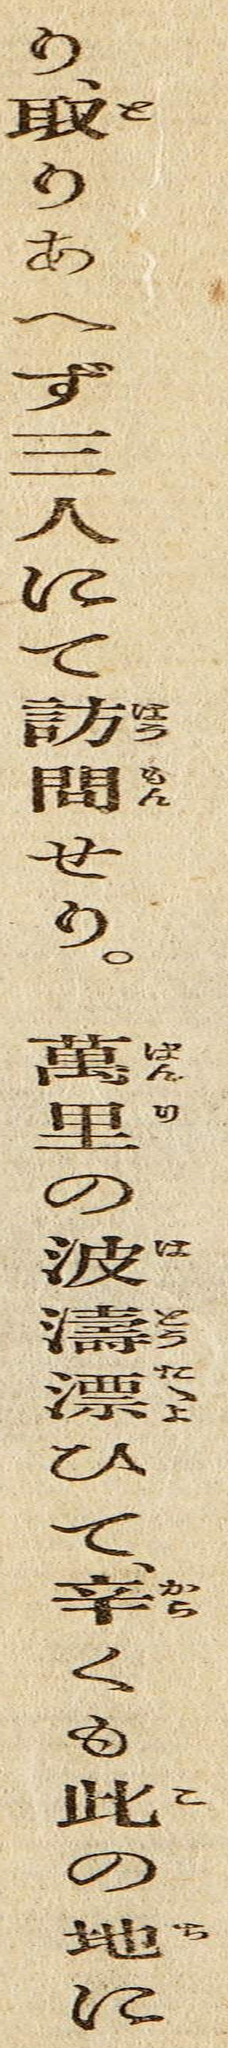り、取りあへず三人にて訪問せり。万里の波濤漂ひて、辛くも此の地に
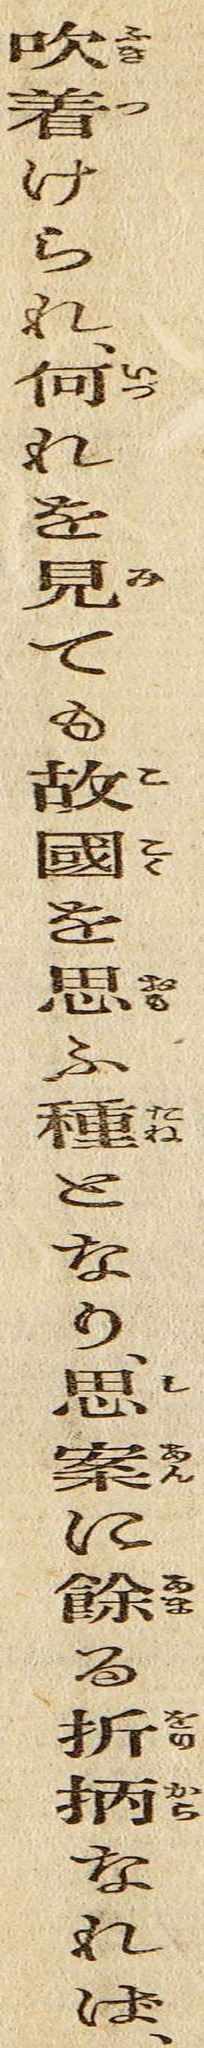吹着けられ、何れを見ても故国を思ふ種となり、思案に余る折柄なれば、
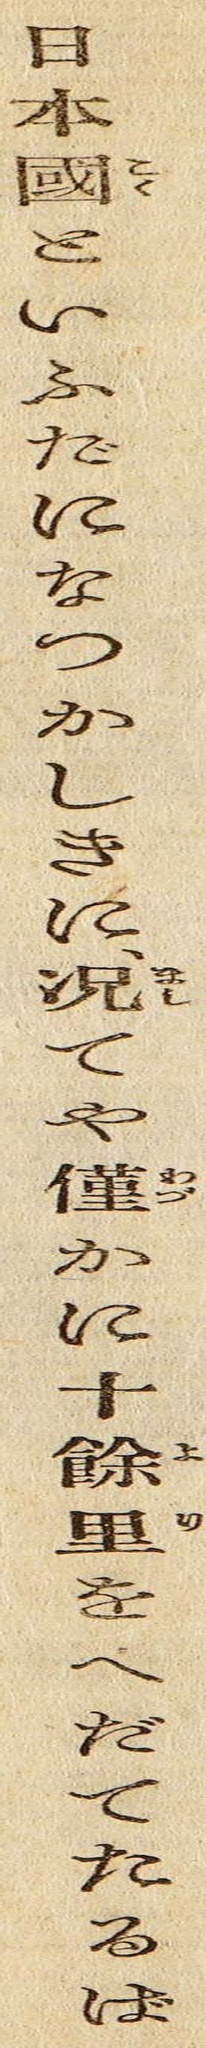日本国といふだになつかしきに、況てや僅かに十余里をへだてたるば
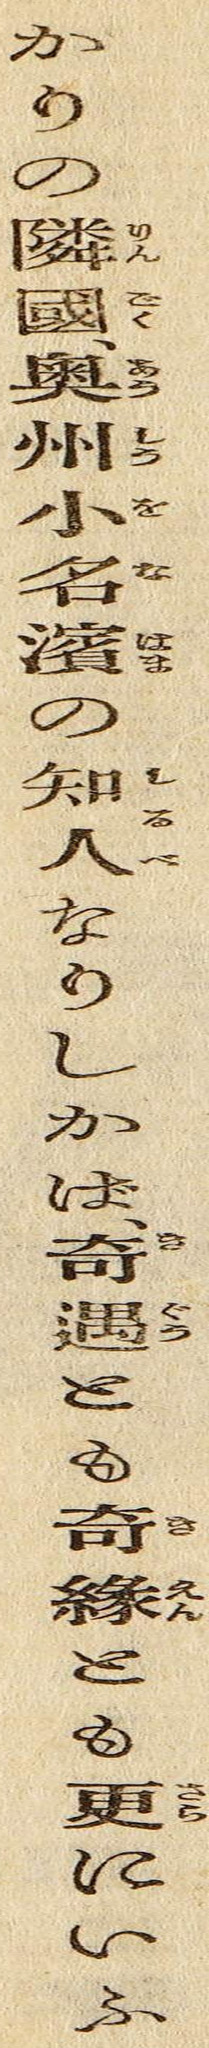かりの隣国、奥州小名浜の知人なりしかば、奇遇とも奇縁とも更にいふ
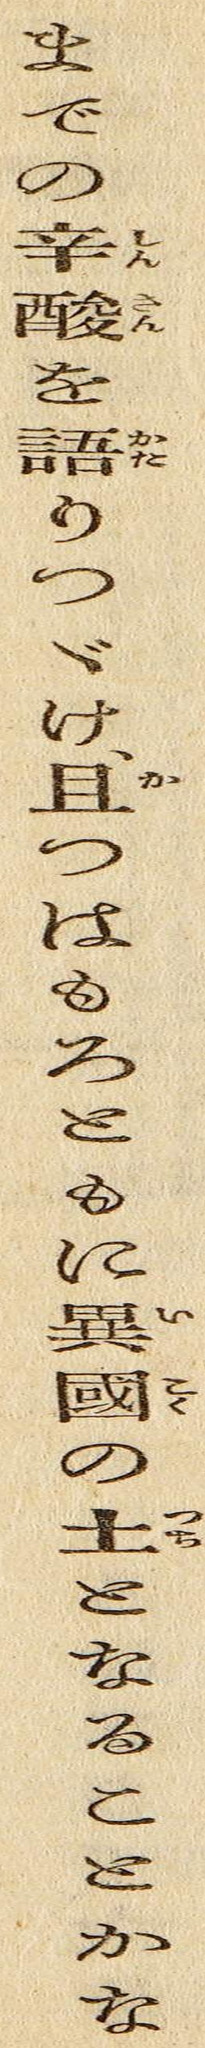までの辛酸を語りつヾけ、且つはもろともに異国の土となることかな
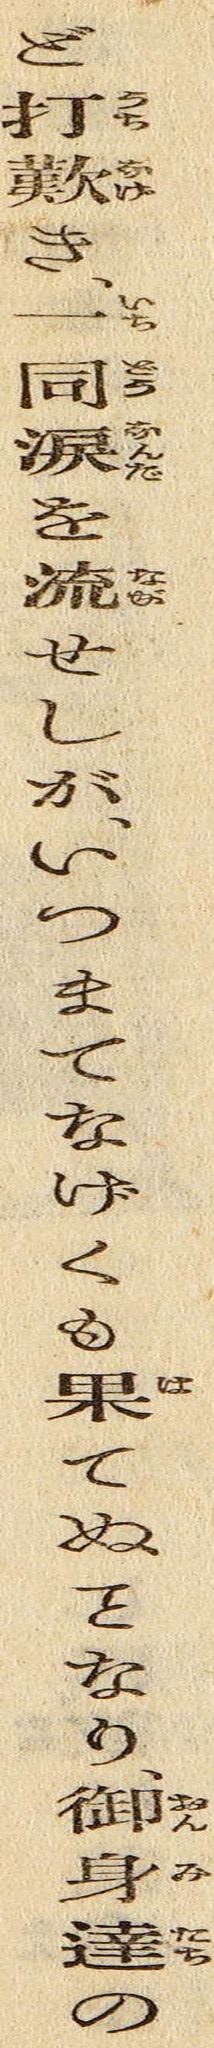ど打歎き、一同涙を流せしが、いつまてなげくも果てぬことなり、御身達の
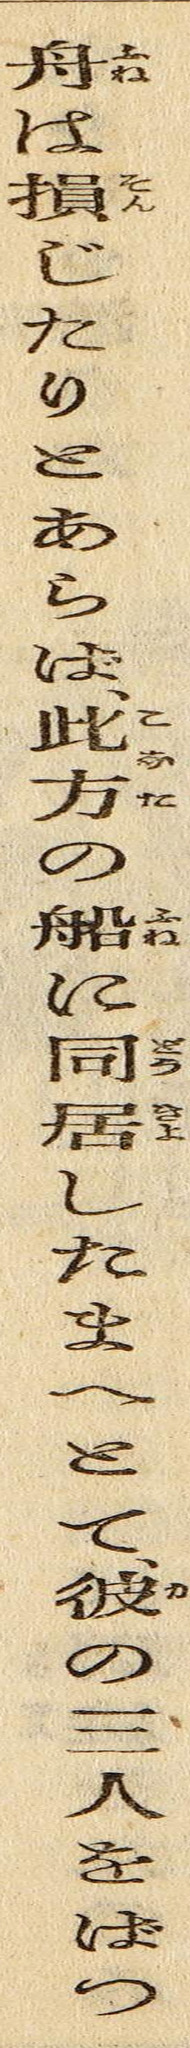舟は損じたりとあらば、此方の船に同居したまへとて、彼の三人をばつ
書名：日本漂流譚
